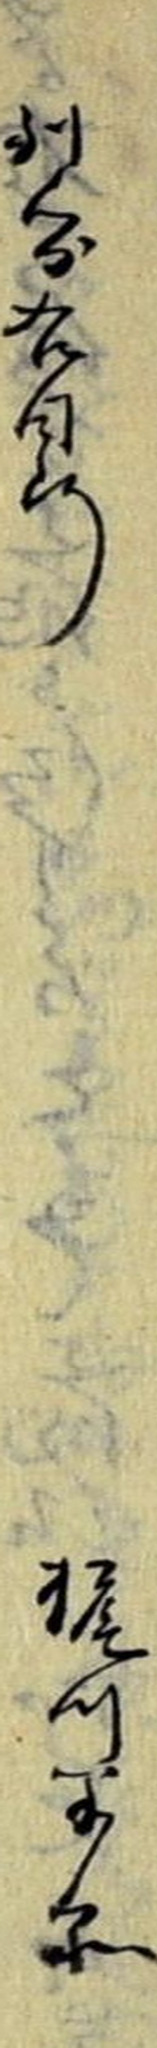別紙右同断梶川半兵衛
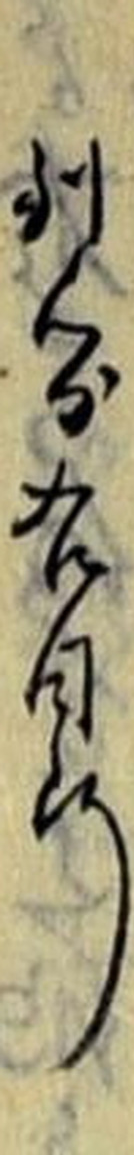別紙右同断
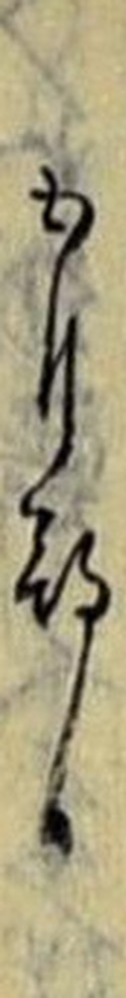五月朔日
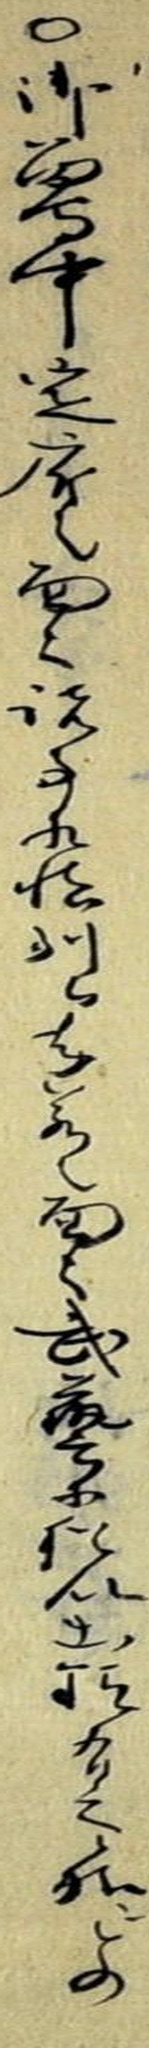○御留守中定府之面々諸事相慎別而年若之面々武芸等猶以出精有之候様にとの
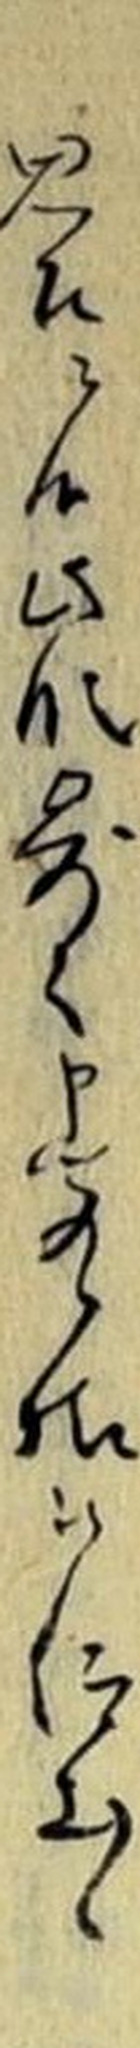思召に候此段寄々申聞候様被仰出候
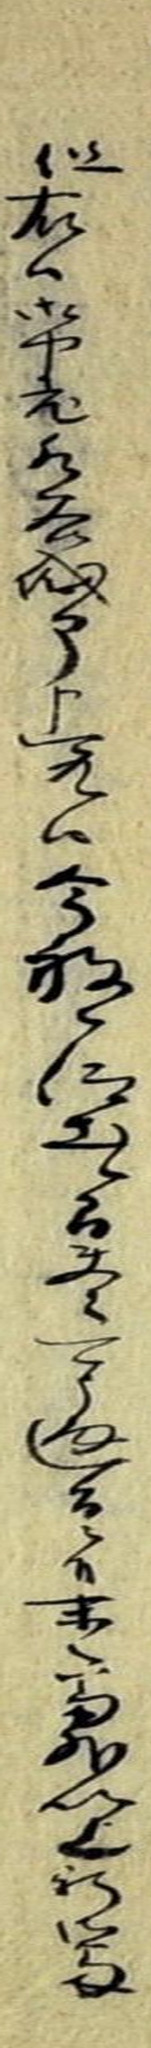但右は御中老水谷織部申聞候は今般被仰出候間夫々可申通旨に付末之番外以上新御番
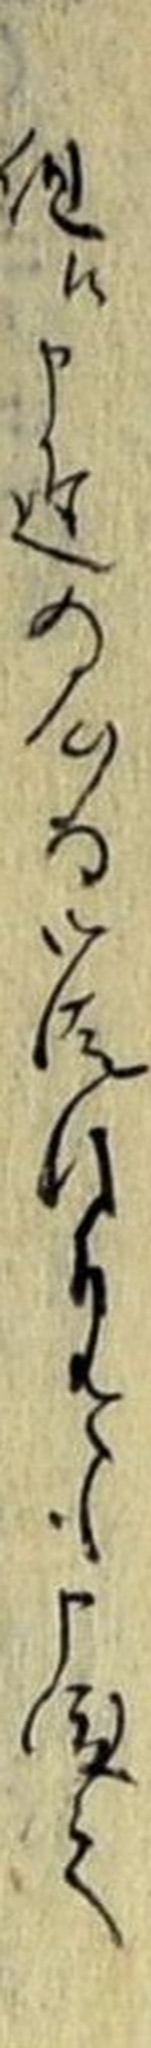組江申達為心得以後目付共へも申渡之
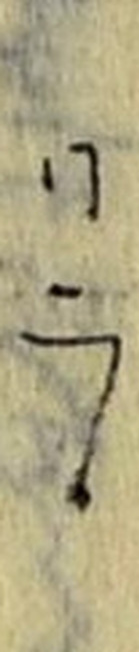同二日
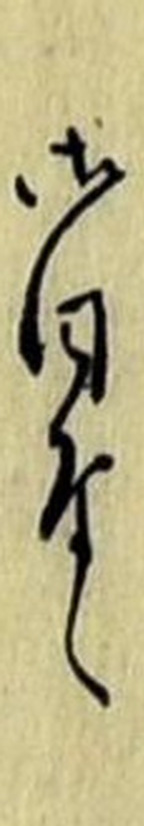御目付へ
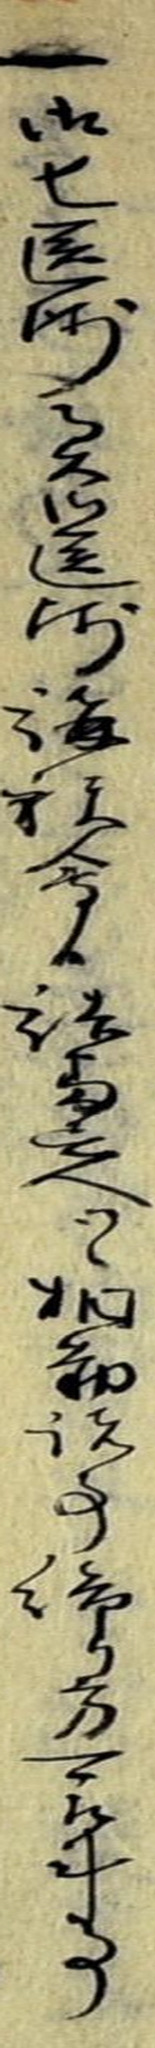一御匕医師奥御医師講釈会は詰番壱人つヽ相勤諸事締り方可取斗事
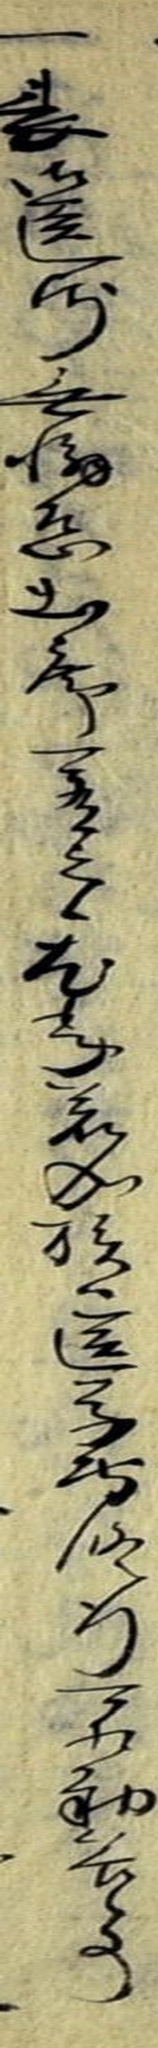一表御医師無懈怠出席可被有之申渡候尤年若成族は医学専修行可相勤筈候事
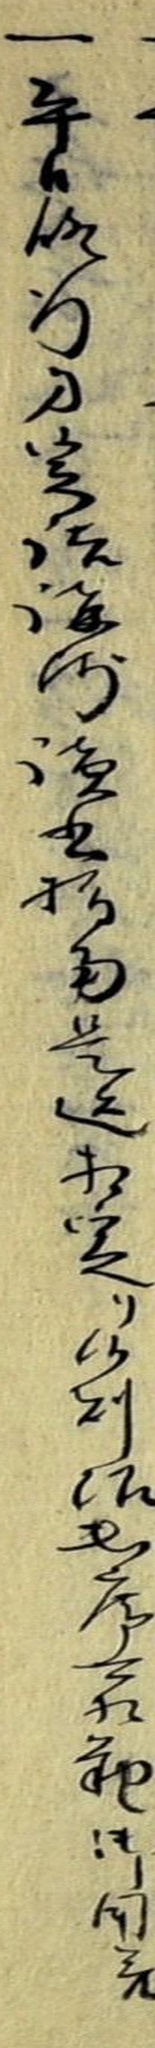一平日修行方定詰講師演書指南是迄相定り候則様出席可相勤候御用并

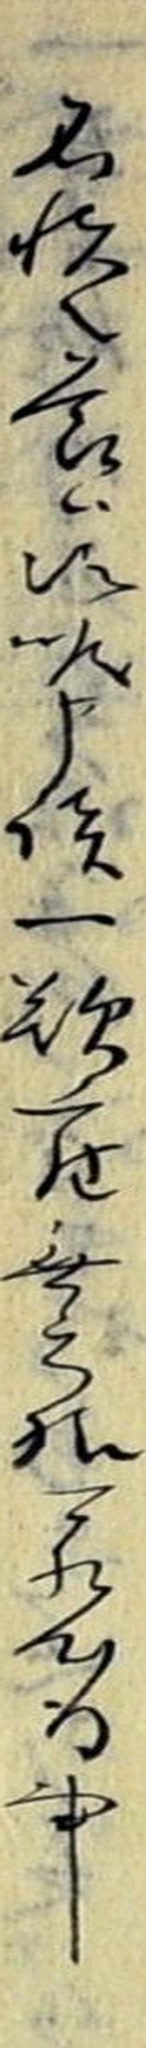不快之節は次順申談一歎之座無之様可相心得事
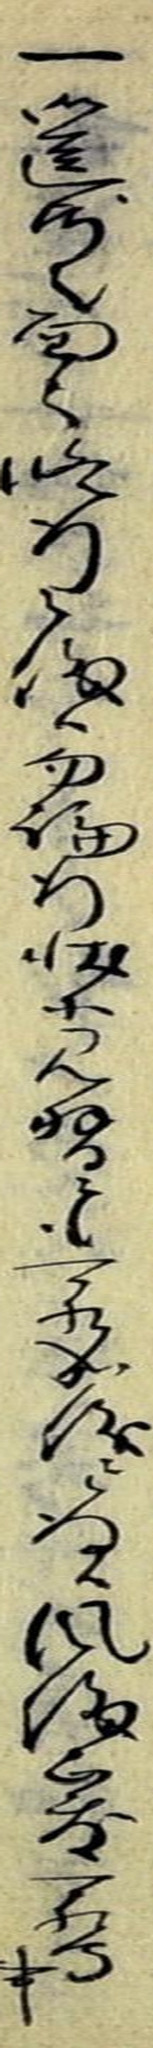一医師之面々修行之儀は勿論行状等見習にも可相成儀に候得は風儀正敷可相守事
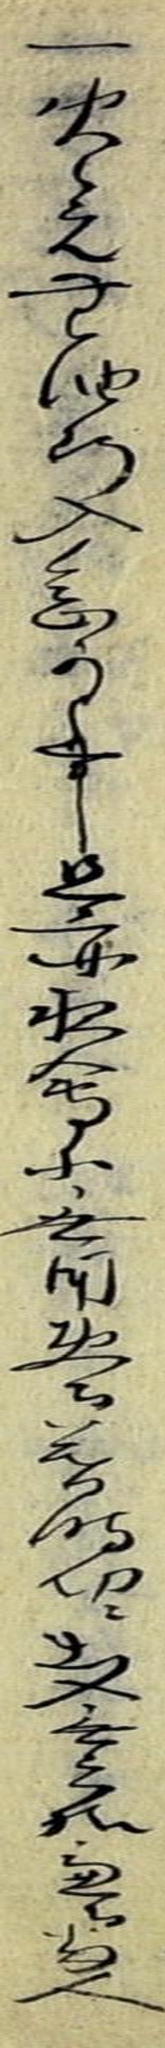一火之元無由断入念可申事且亦夜会等無用決而暮時切に出入無之様兼而番人
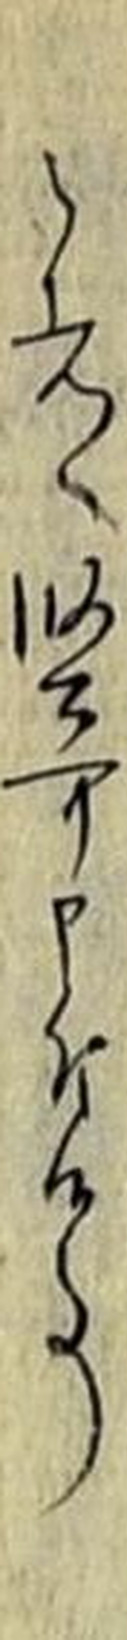之者へ堅可申付候事
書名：命令之部 四
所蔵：福井県文書館 Fukui Prefectural Archives
